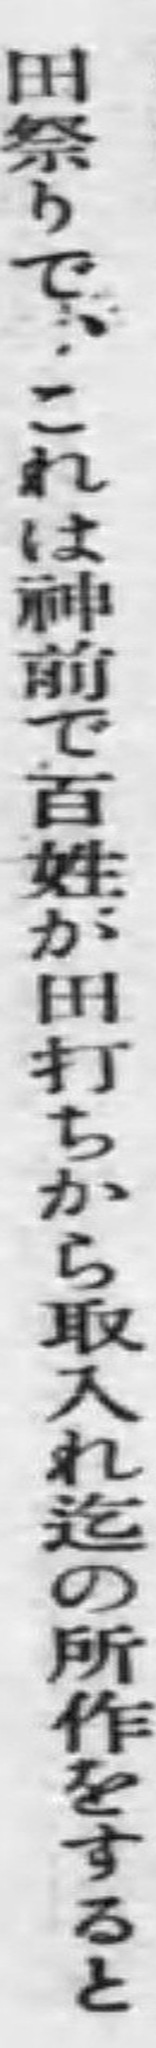田祭りで、これは神前で百姓が田打ちから取入れ迄の所作をすると
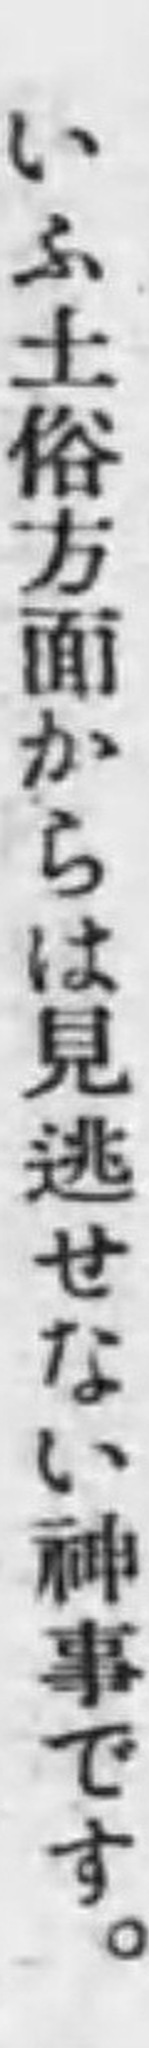いふ土俗方面からは見逃せない神事です。
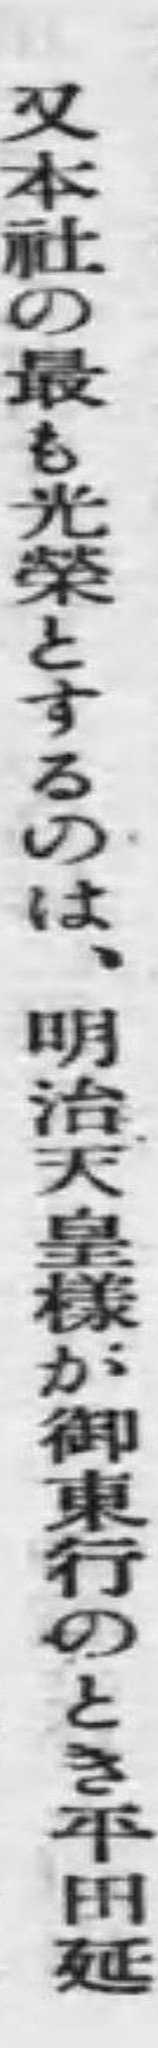又本社の最も光栄とするのは、明治天皇様が御東行のとき平田延
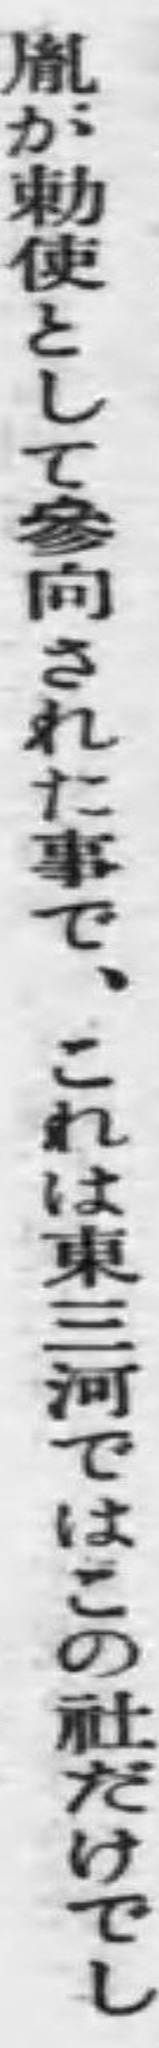胤が勅使として参向された事で、これは東三河ではこの社だけでし
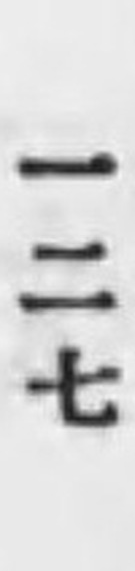一二七

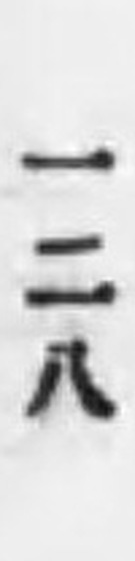一二八
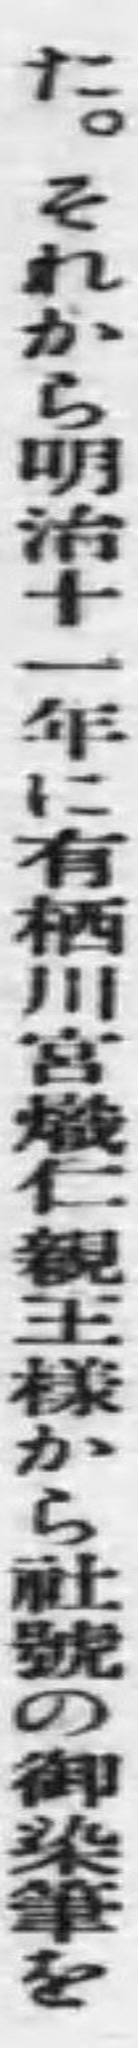た。それから明治十一年に有栖川宮熾仁親王様から社号の御染筆を
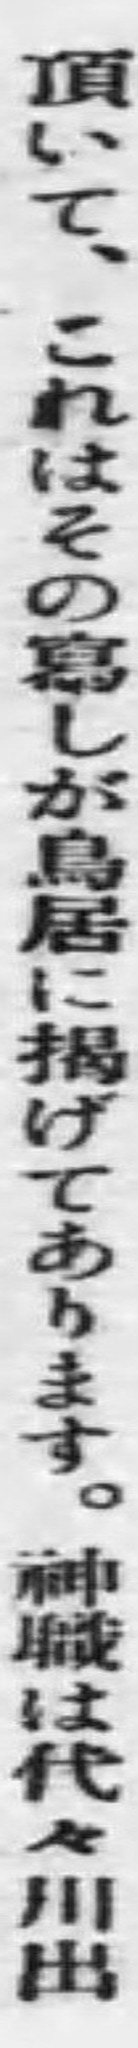頂いて、これはその写しが鳥居に掲げてあります。神職は代々川出
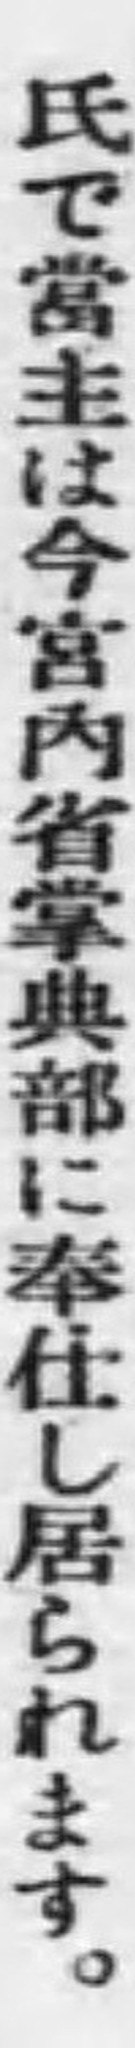氏で当主は今宮内省掌典部に奉仕し居られます。
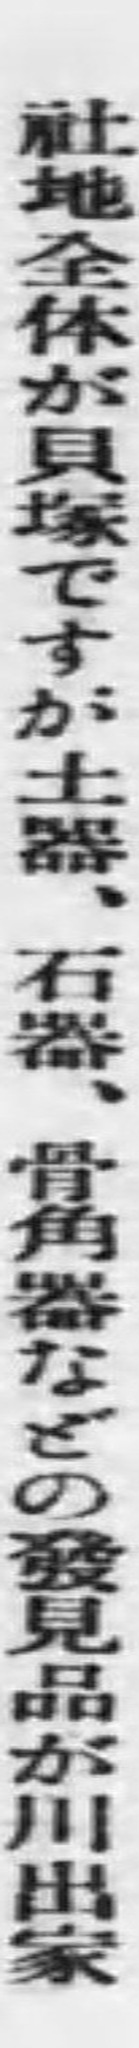社地全体が貝塚ですが土器、石器、骨角器などの発見品が川出家
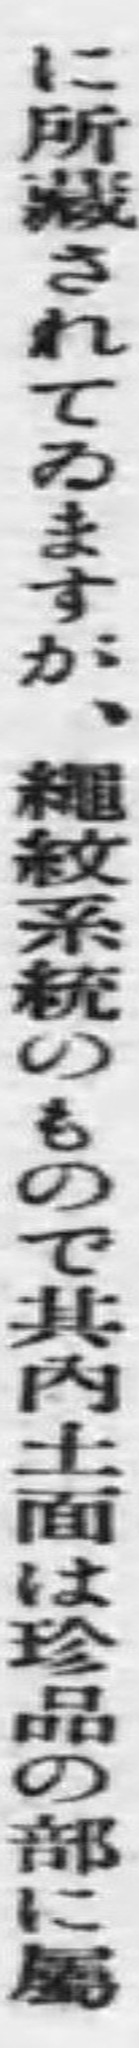に所蔵されてゐますが、縄紋系統のもので其内土面は珍品の部に属
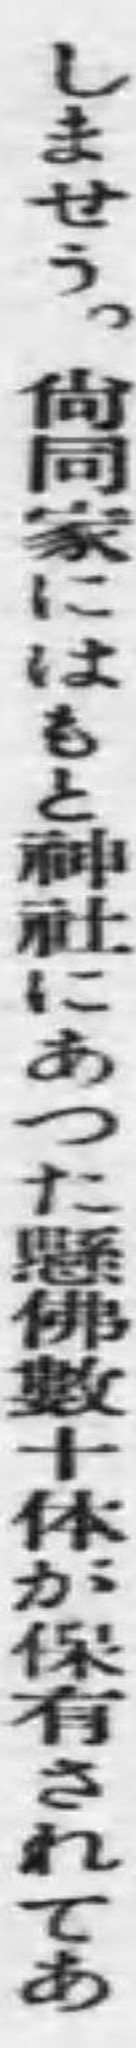しませう。尚同家にはもと神社にあつた懸仏数十体が保有されてあ
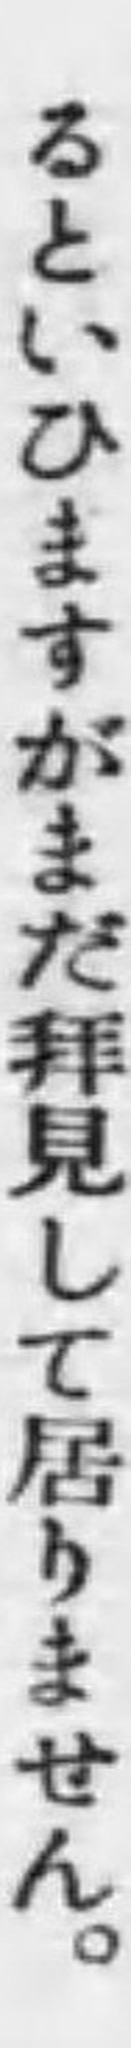るといひますがまだ拝見して居りません。
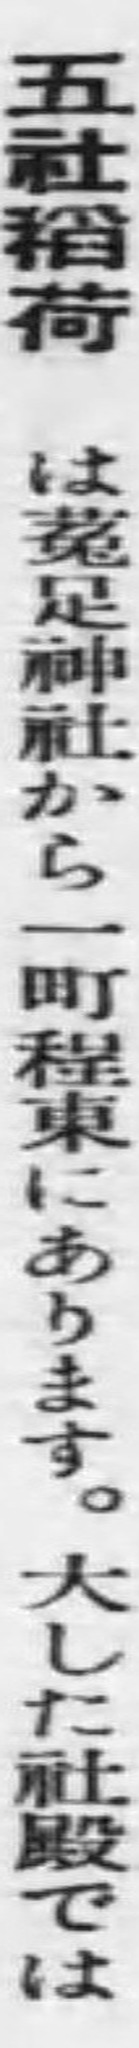五社稲荷は菟足神社から一町程東にあります。大した社殿では
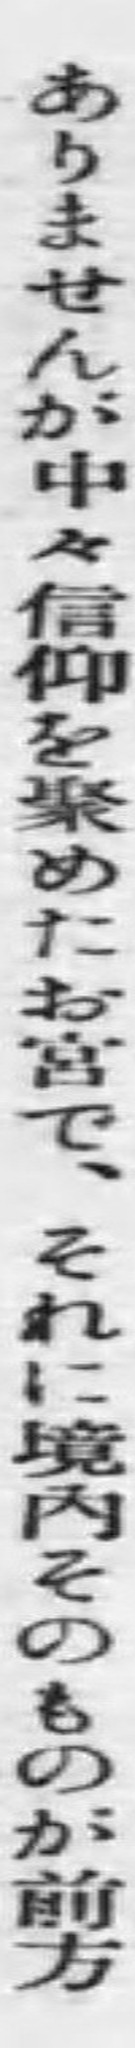ありませんが中々信仰を聚めたお宮で、それに境内そのものが前方
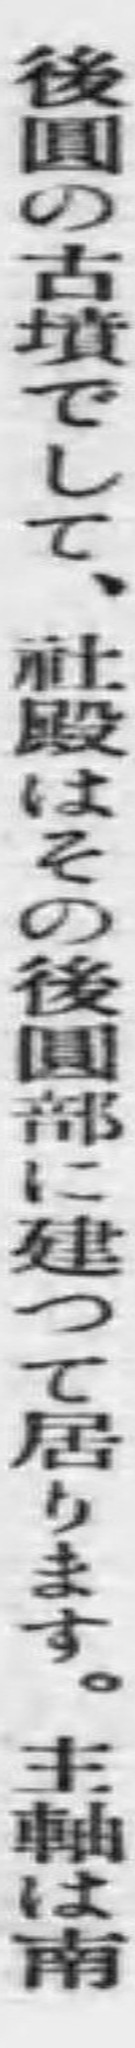後円の古墳でして、社殿はその後円部に建つて居ります。主軸は南
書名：東三河道中記 : 豊橋市及其附近案内
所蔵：国立国会図書館 National Diet Library, JAPAN
